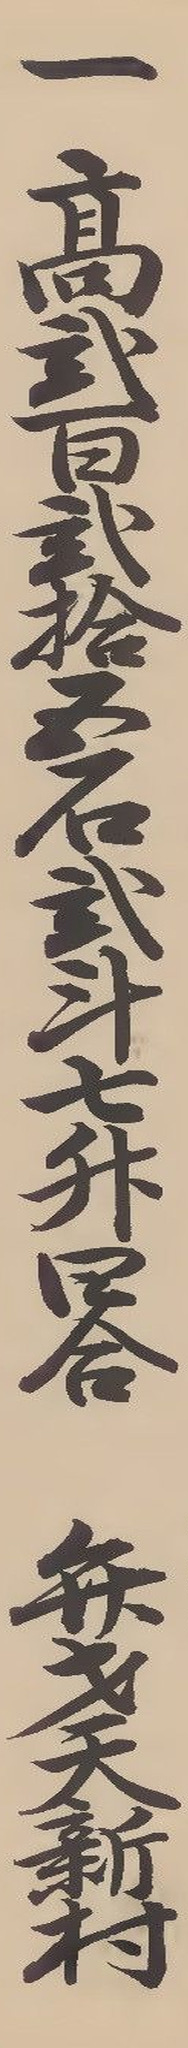一高弐百弐拾五石弐斗七升四合弁才天新村
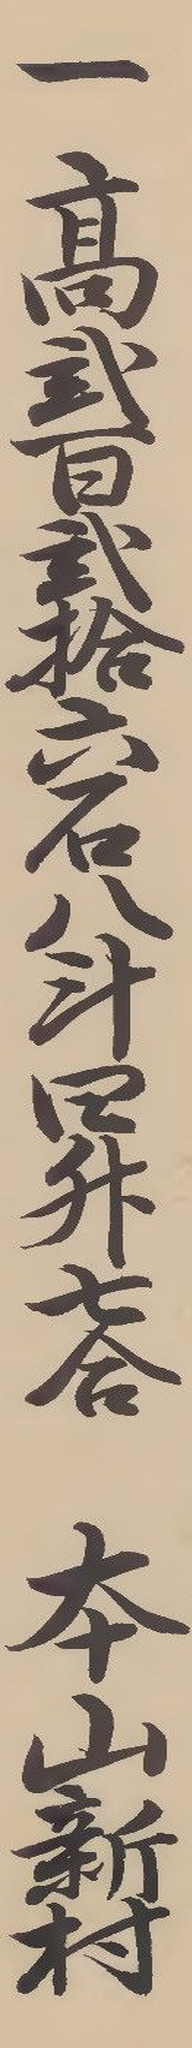一高弐百弐拾六石八斗四升七合本山新村
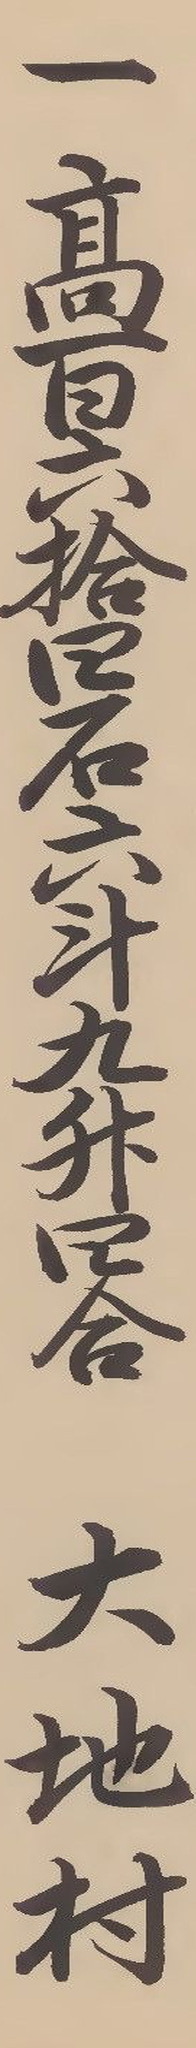一高百六拾四石六斗九升四合大地村
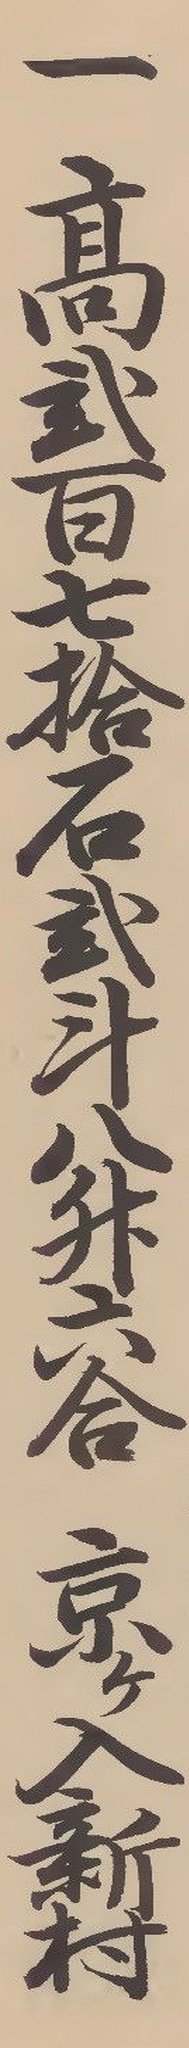一高弐百七拾石弐斗八升六合京ヶ入新村

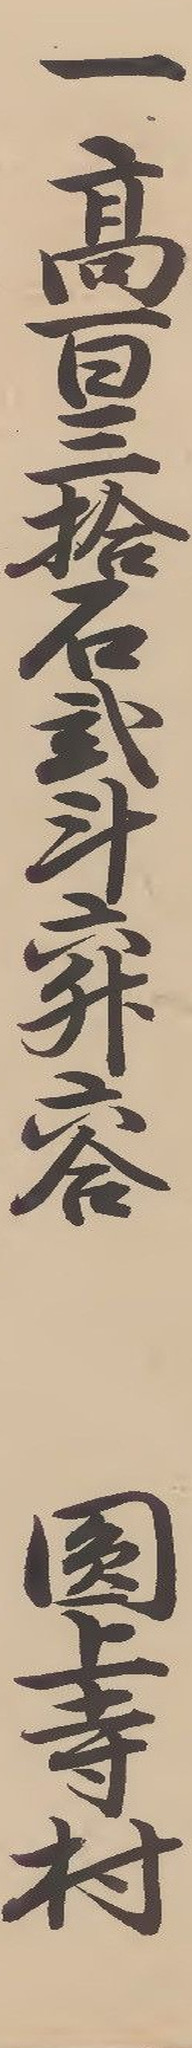一高百三拾石弐斗六升六合円上寺村
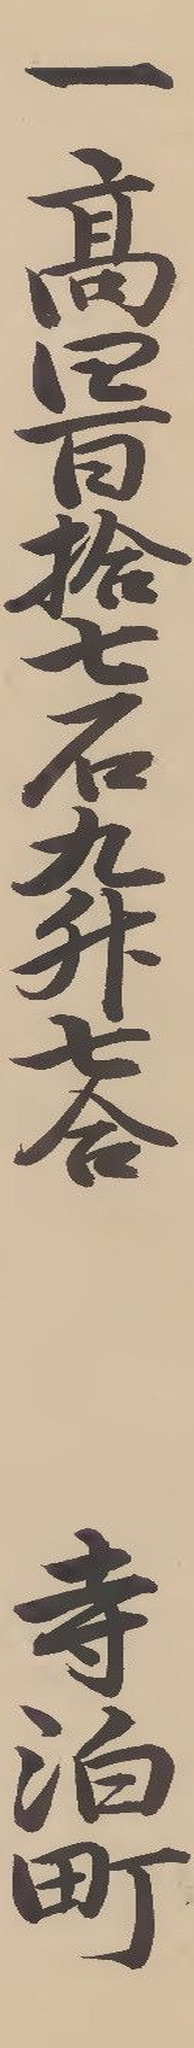一高四百拾七石九升七合寺泊町
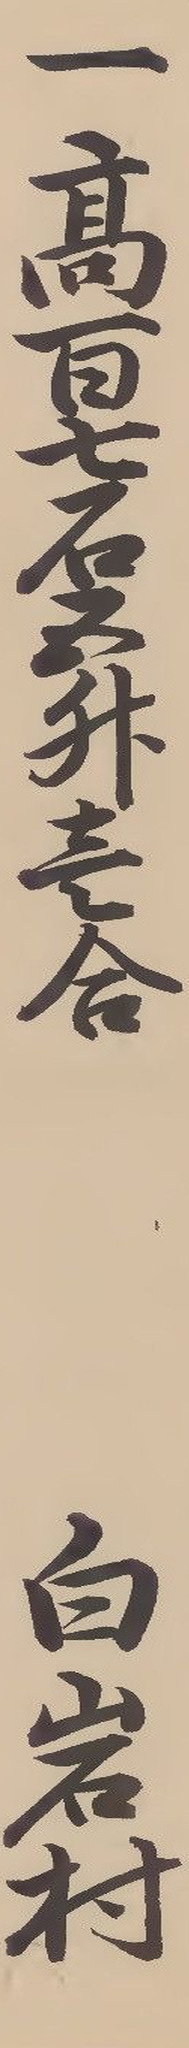一高百七石五升壱合白岩村
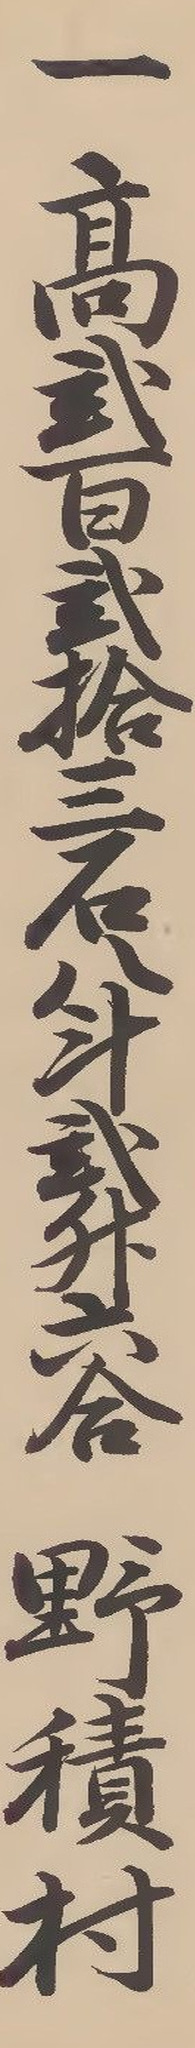一高弐百弐拾三石八斗弐升六合野積村
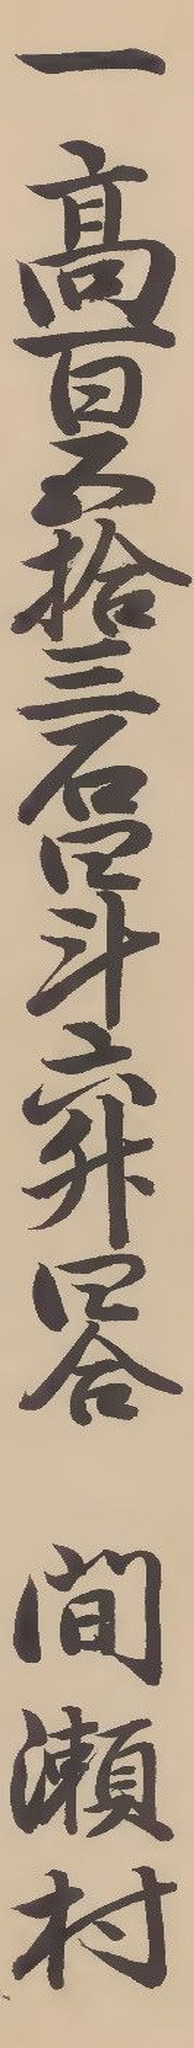一高百五拾三石四斗六升四合間瀬村
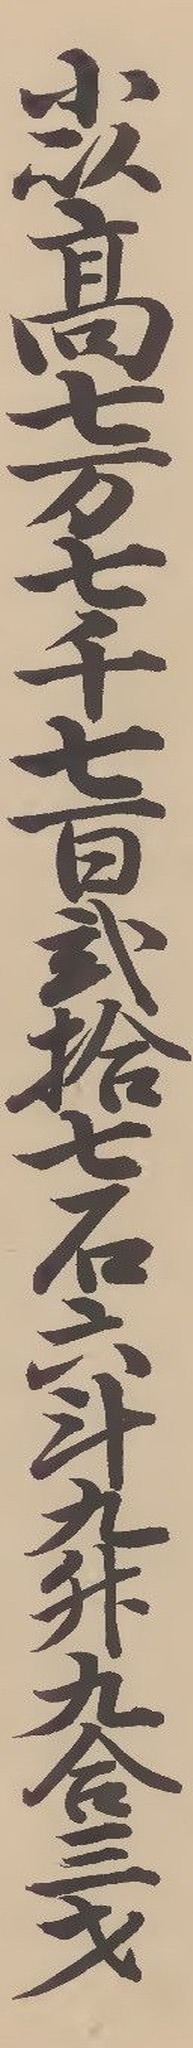小以高七万七千七百弐拾七石六斗九升九合三才
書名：越後国郷帳　中
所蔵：国立公文書館 National Archives of Japan
